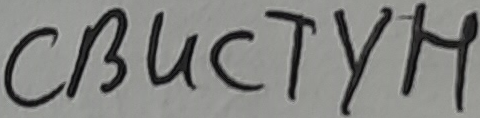свистун
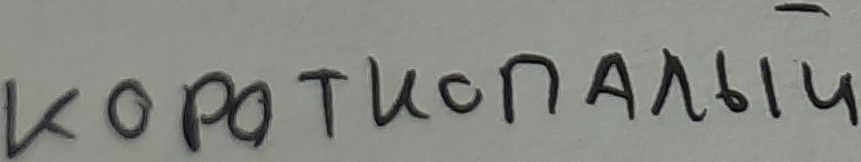короткопалый
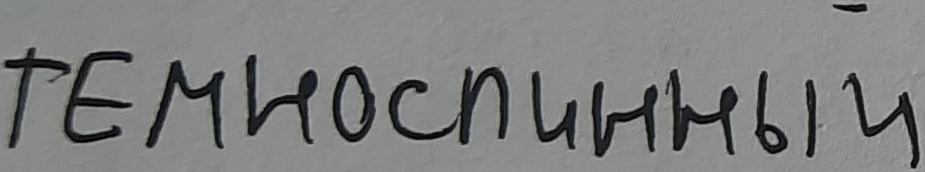темноспинный
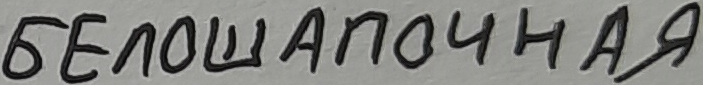белошапочная
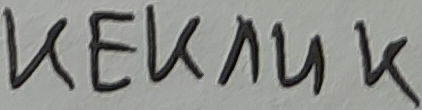кеклик
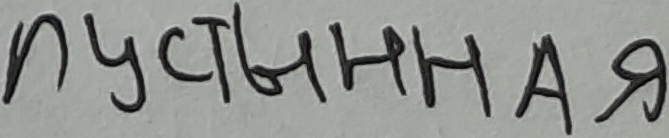пустынная
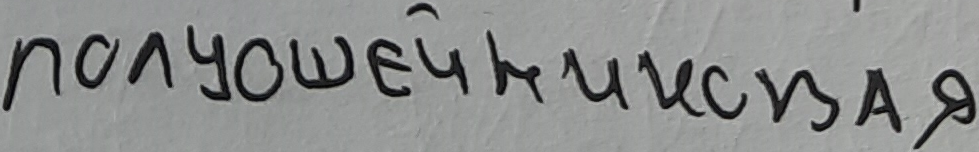полуошейниковая
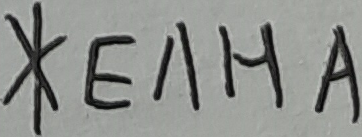желна
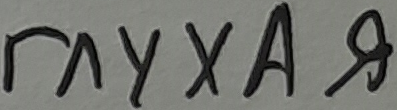глухая
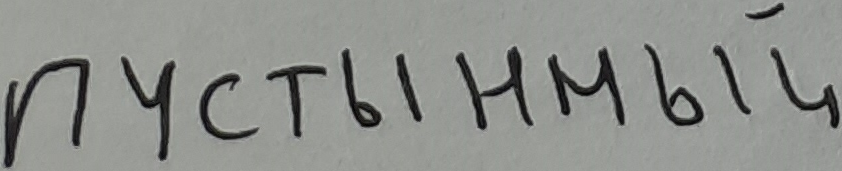пустынный
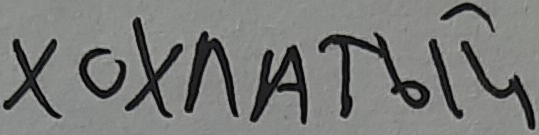хохлатый
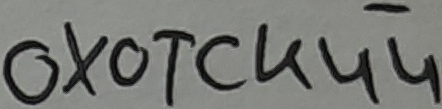охотский
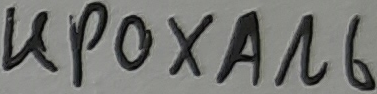крохаль
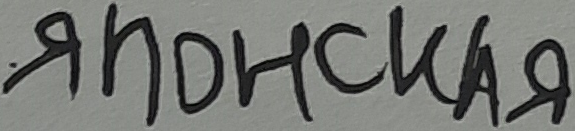японская
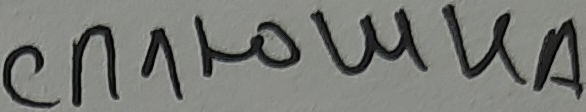сплюшка
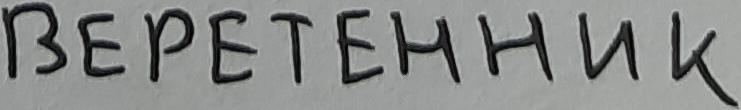веретенник
